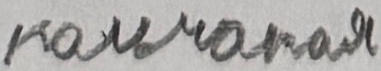кольчапая
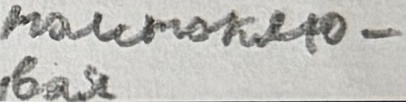толстоклю-вая
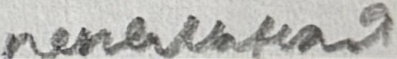пепельная
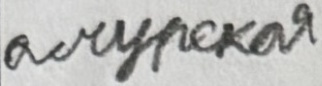амурская
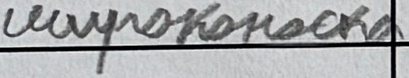широконоска
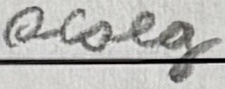осоед
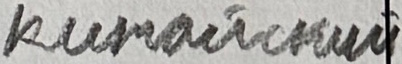китайский
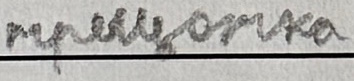трещотка
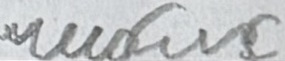чибис
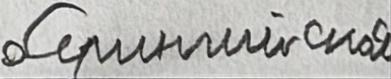берингийская
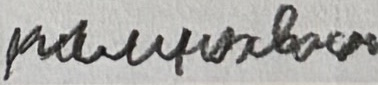камнохвост
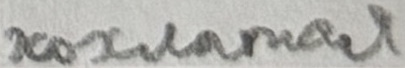хохлатая
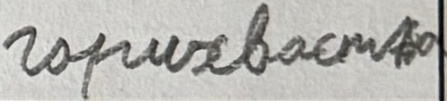горихвостка
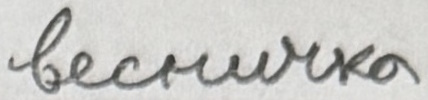весничка
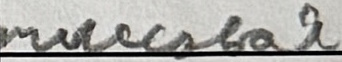тиссовая
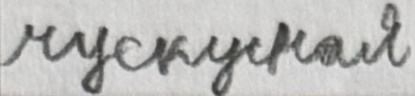мускусная
